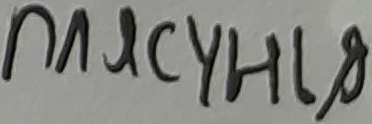плясунья
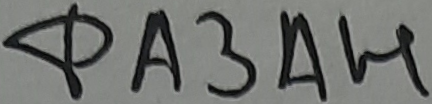фазан
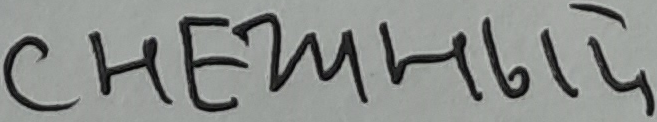снежный
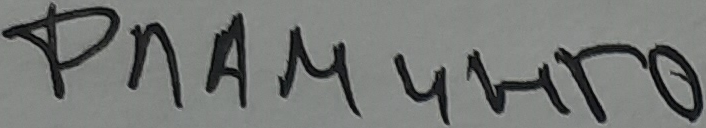фламинго
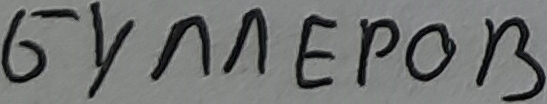буллеров
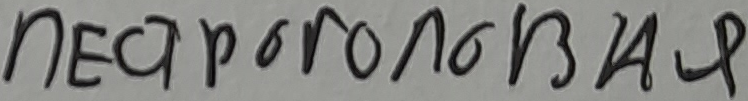пестроголовая
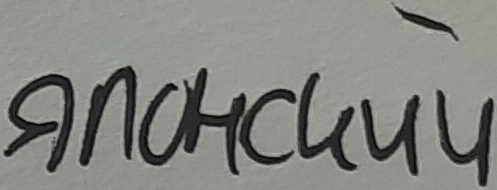японский
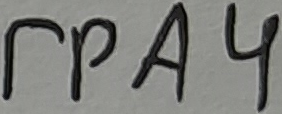грач
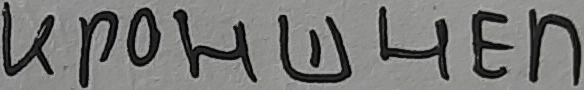кроншнеп
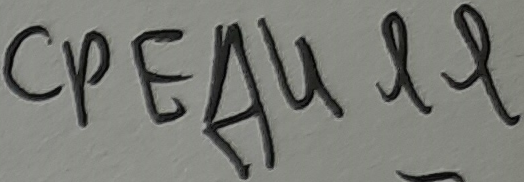средняя
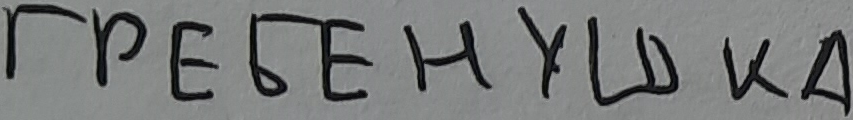гребенушка
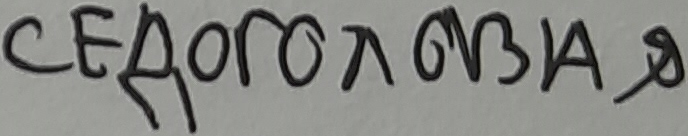седоголовая
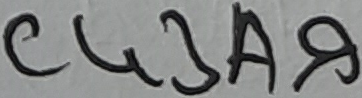сизая
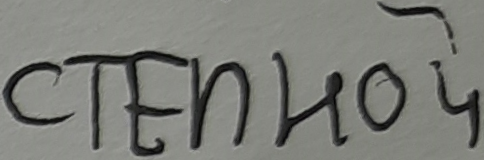степной
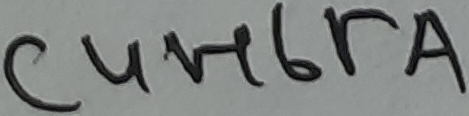синьга
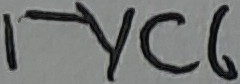гусь
